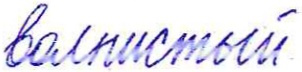волнистый
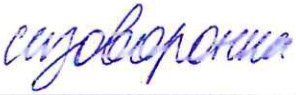сизоворонка
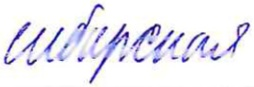сибирская
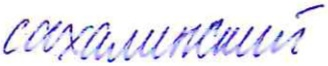сахалинский
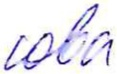сова
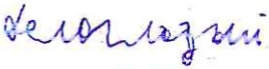белоглазый
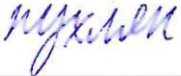пухляк
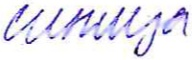синица
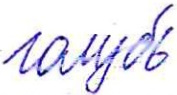голубь
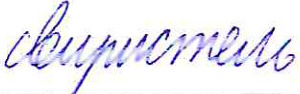свиристель
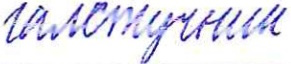галстучник
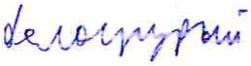белогрудый
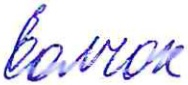волчок
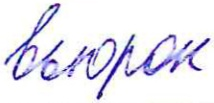вьюрок
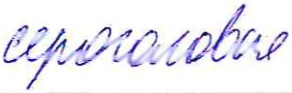сероголовая
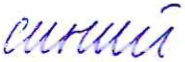синий
